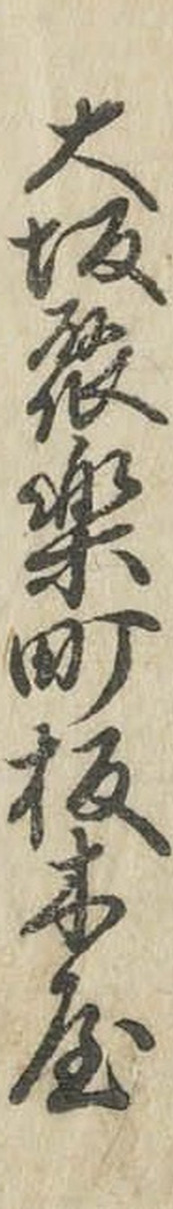聚楽町板木屋
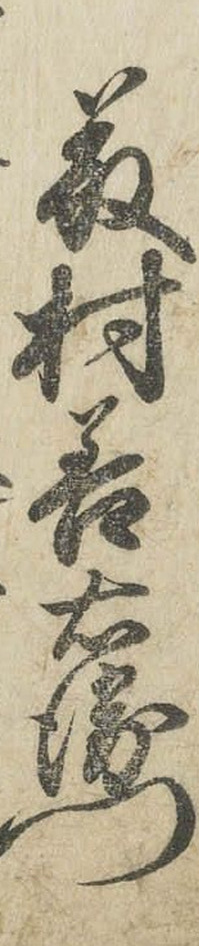藤村善右衛門
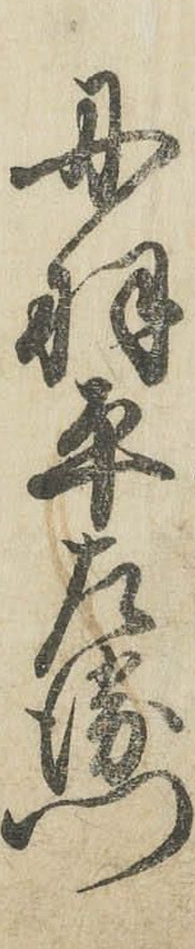丹羽平左衛門
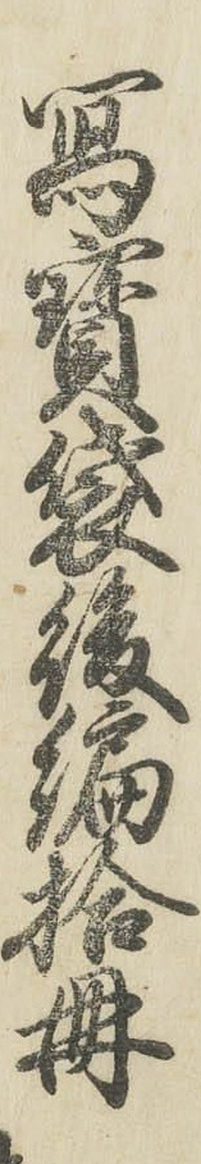写宝袋後編拾冊
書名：絵本写宝袋 9巻 3之巻
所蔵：東京学芸大学教育コンテンツアーカイブ
